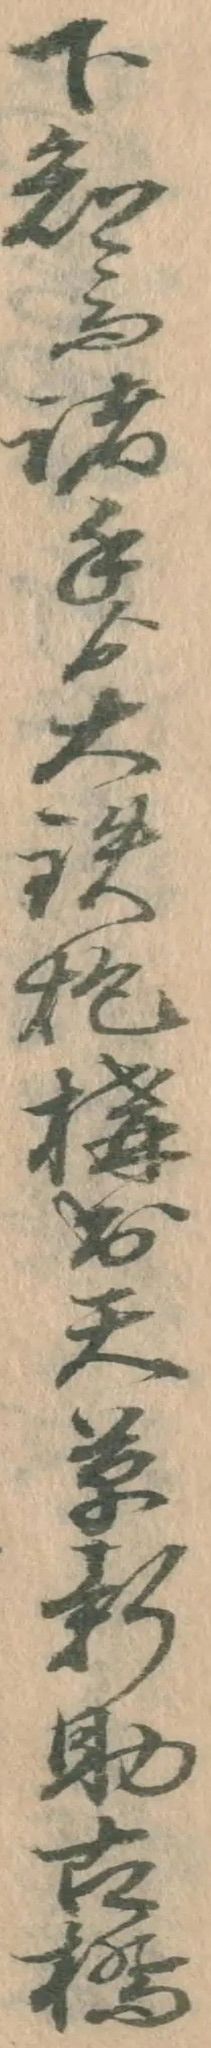下知に而諸手ゟ大鉄炮構出天草新助古橋
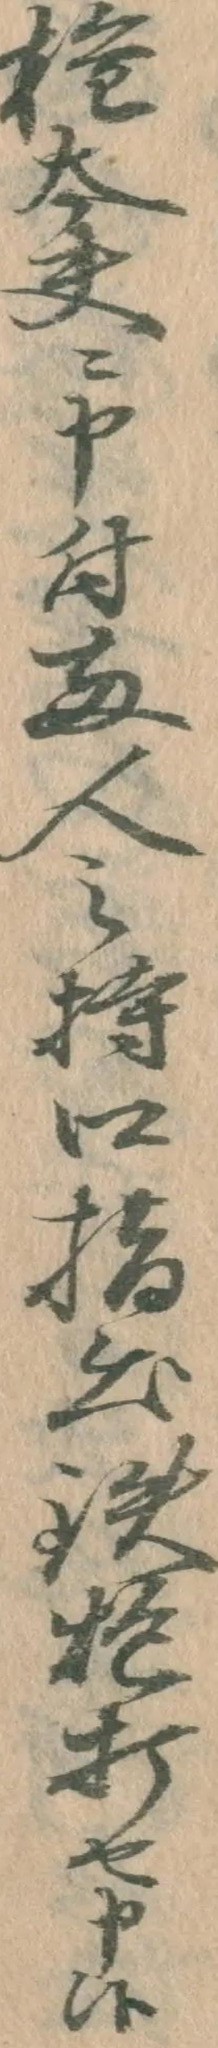権太夫に申付両人之持口指出鉄炮打セ申候
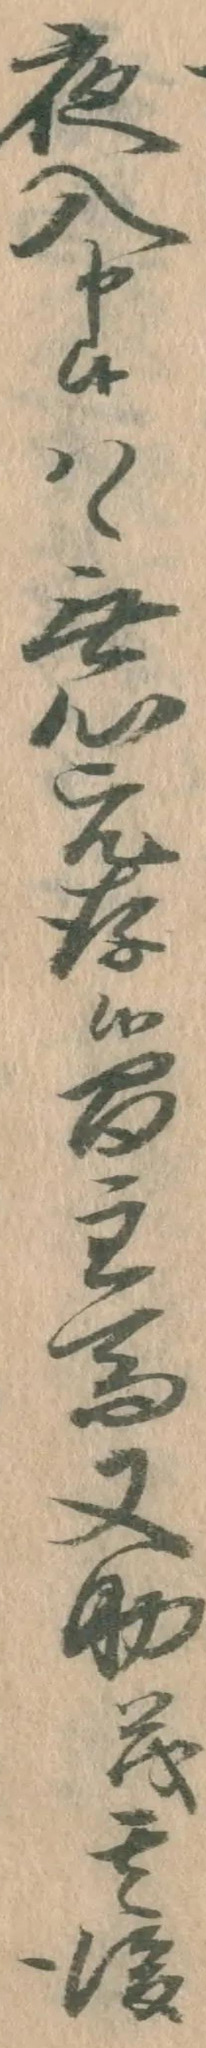夜入申候はゝ無心元存候間主馬又助も其後
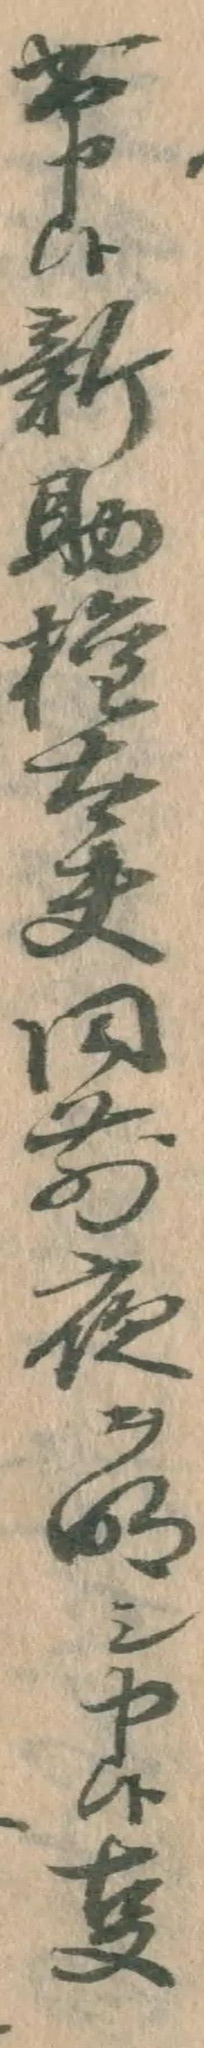出申候新助権太夫同前夜ヲ明シ申候事
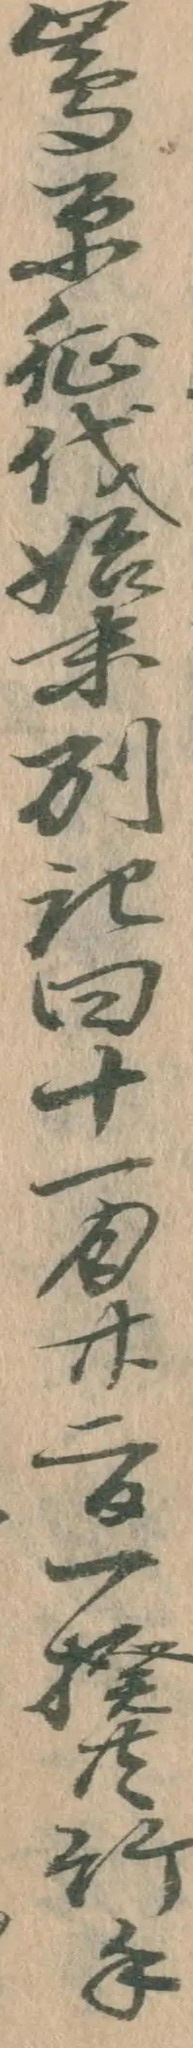島原征伐始末列記曰十一月廿二日一揆共竹手
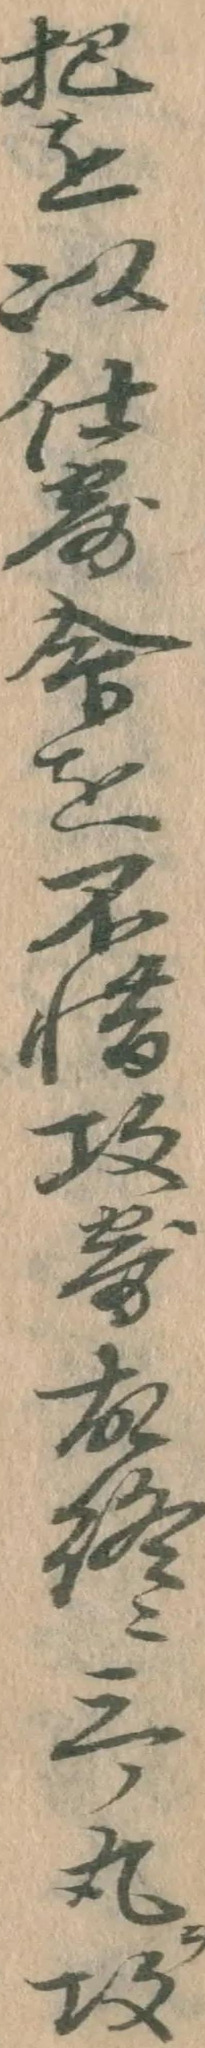把を以仕寄命を不惜攻寄故終に三ノ丸ヲ攻
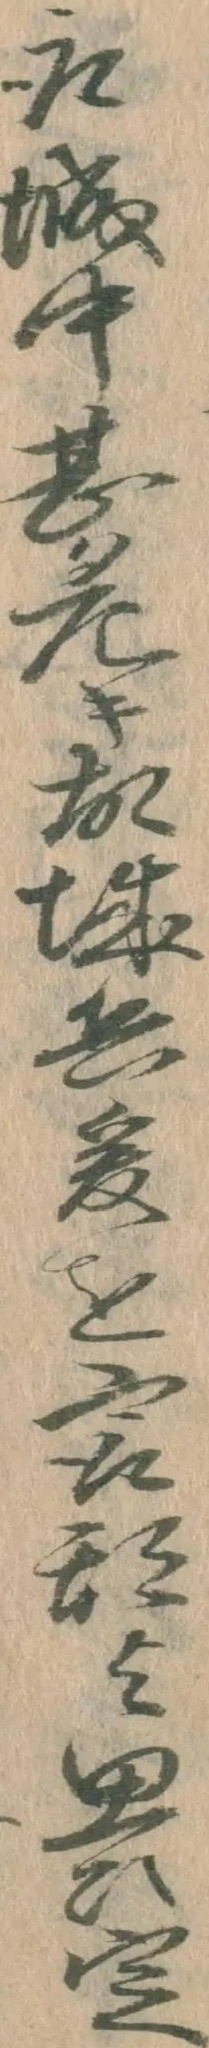取城中甚危キ故城兵爰を最期と思ひ定
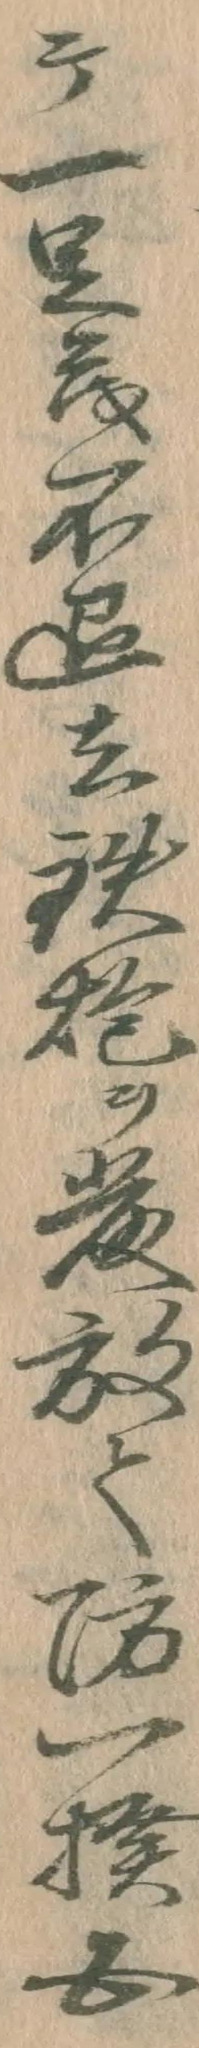テ一足も不退去鉄炮ヲ厳放て防一揆五
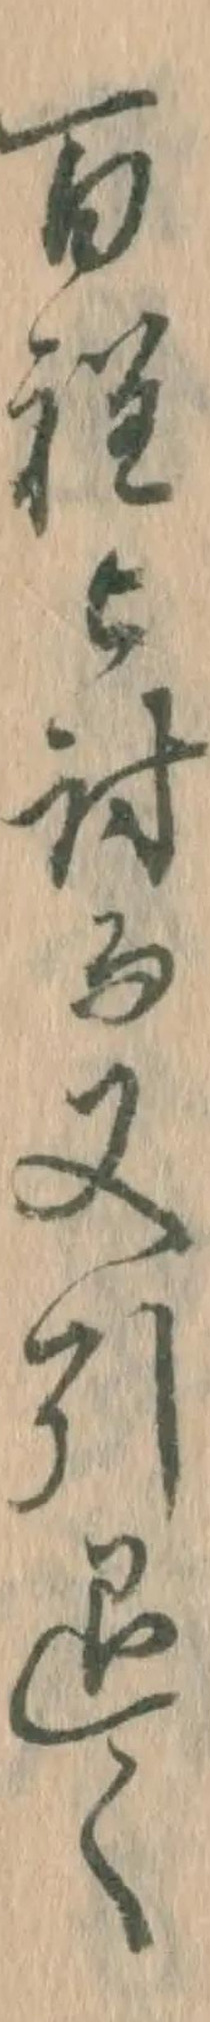百程被討而又引退く
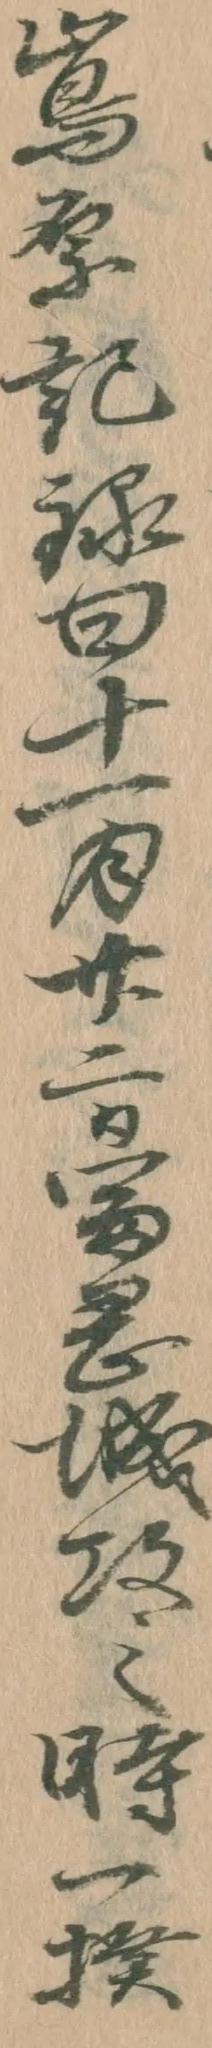島原記録曰十一月廿二日富岡城攻之時一揆
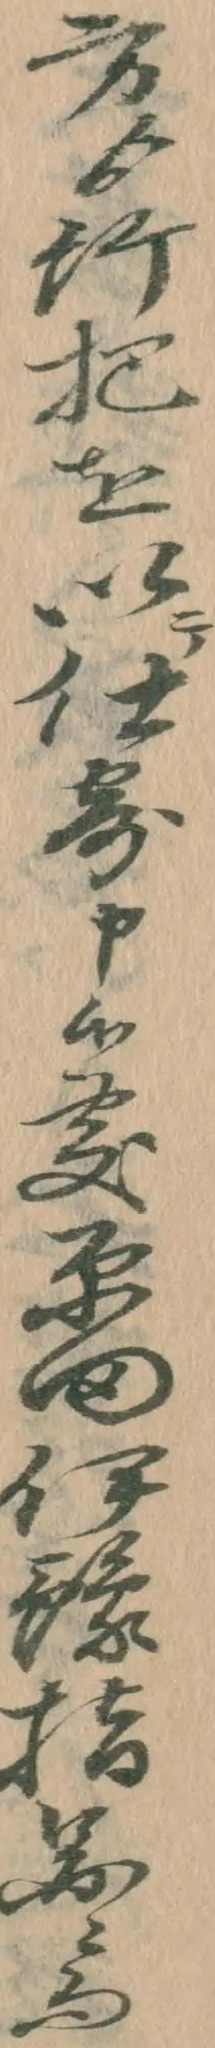方ゟ竹把を以テ仕寄申候処原田伊予指図に而
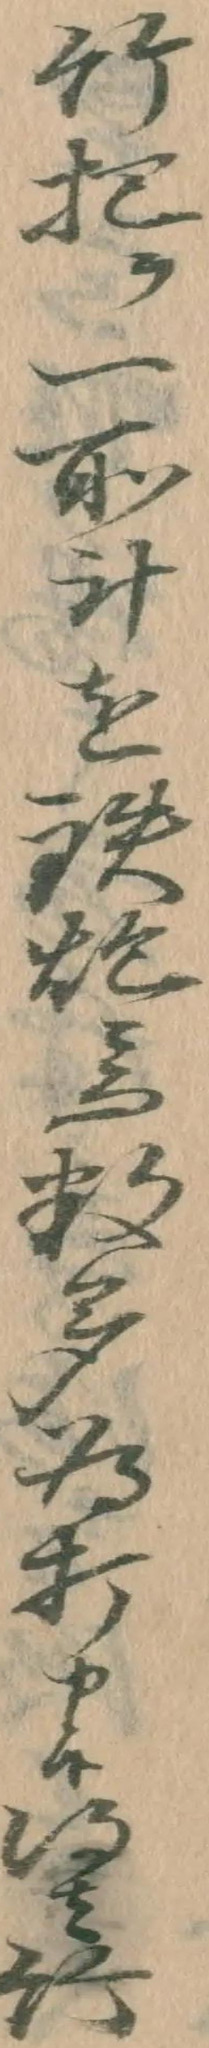竹把ヲ一所計を鉄炮に而数多為打申候得は竹
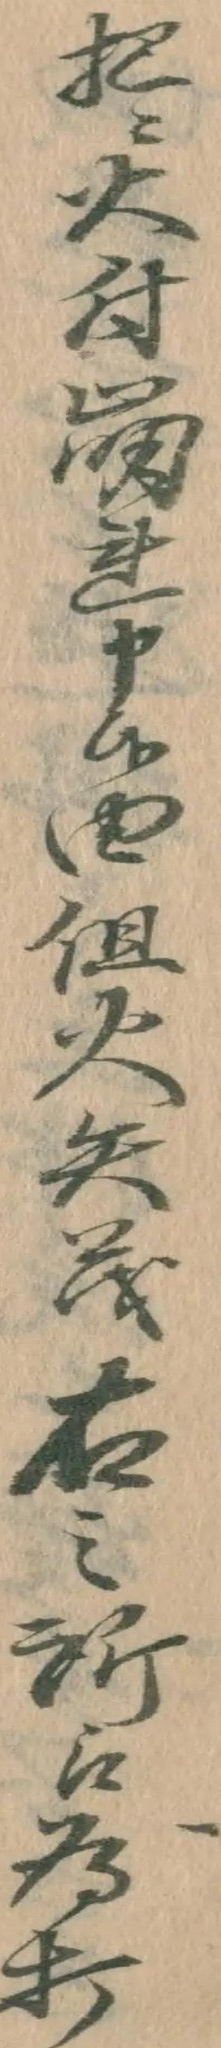把に火付崩れ申候由但火矢も右之所え為打
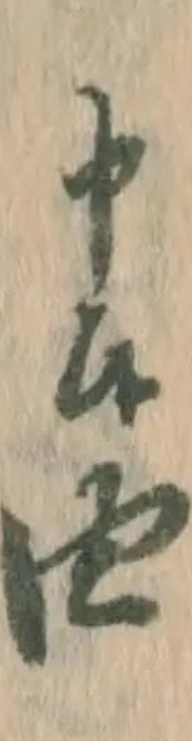申候由
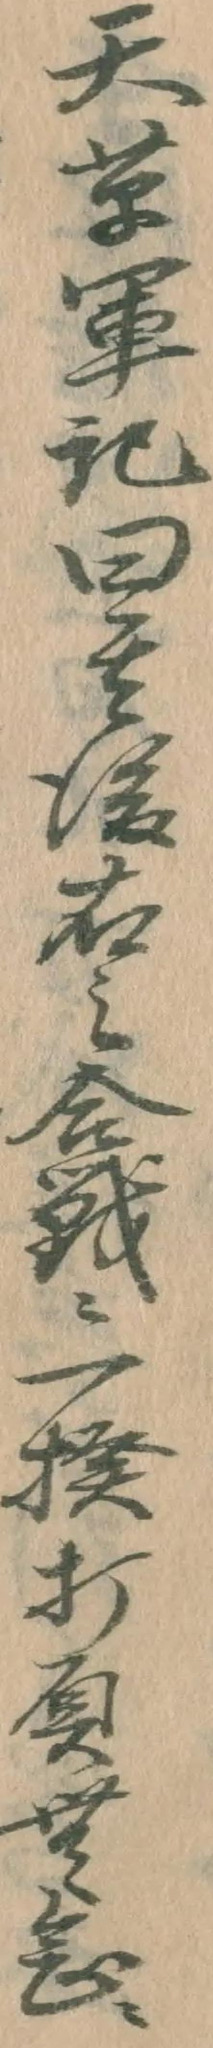天草軍記曰其後右之合戦に一揆打負無念に
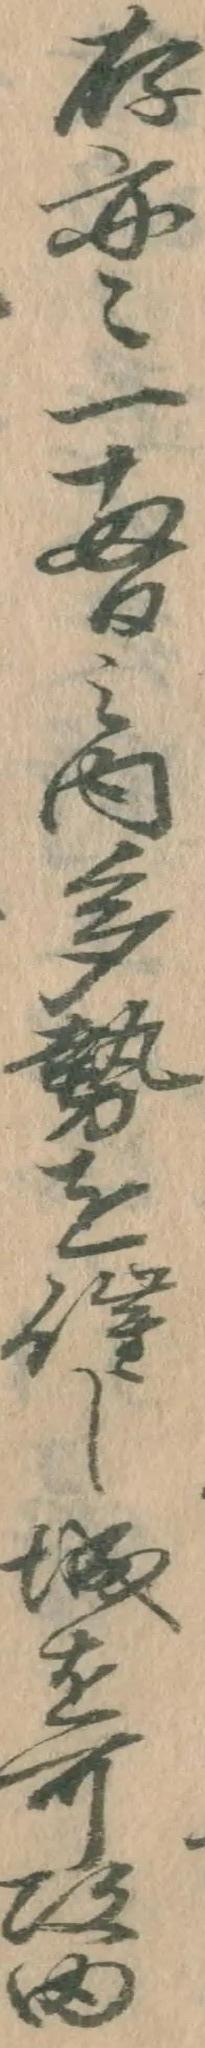存亦々一両日之内多勢を催し城を可攻由
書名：切支丹御退治記 49巻. [3]
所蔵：国立国会図書館 National Diet Library, JAPAN
